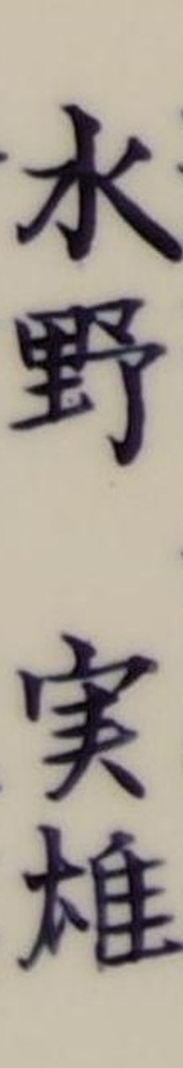水野実雄
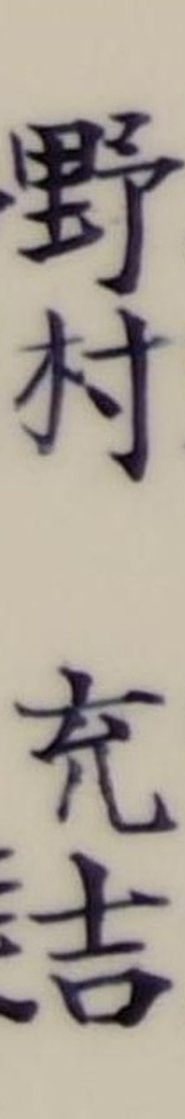野村充吉
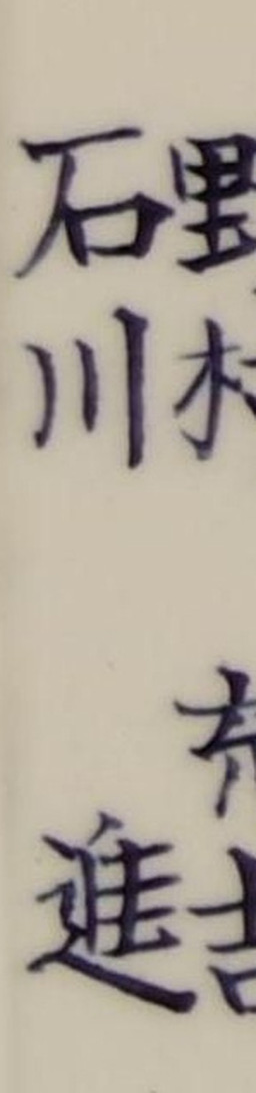石川進

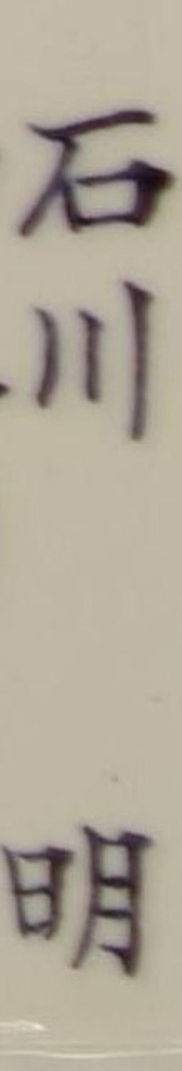石川明
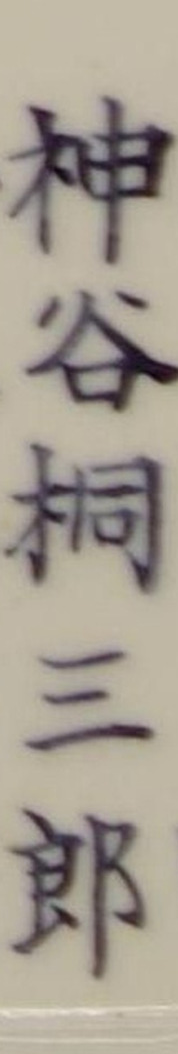神谷桐三郎
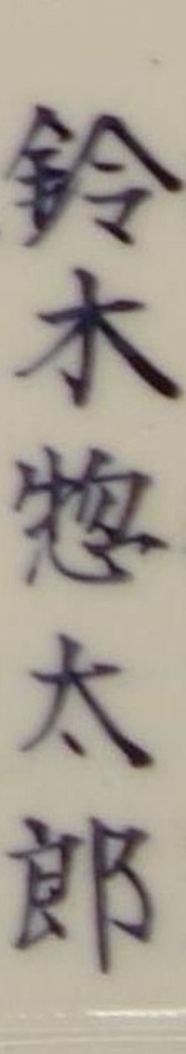鈴木惣太郎
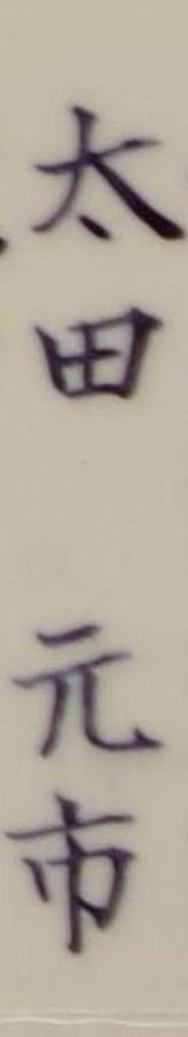太田元市
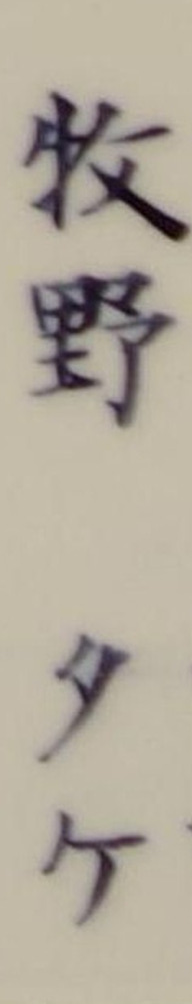牧野タケ
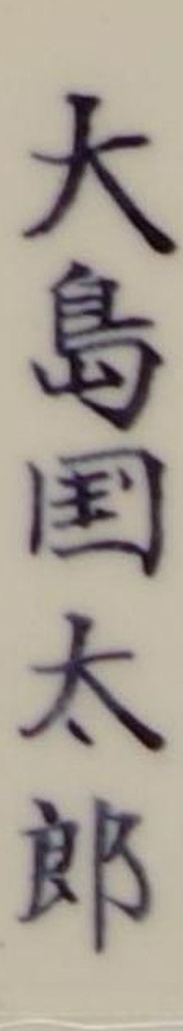大島国太郎
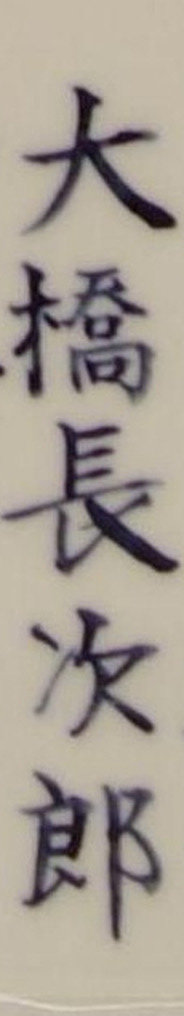大橋長次郎
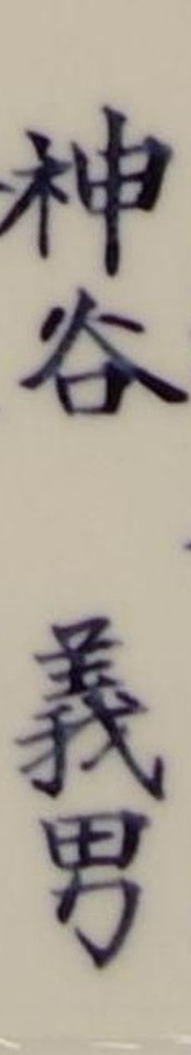神谷義男
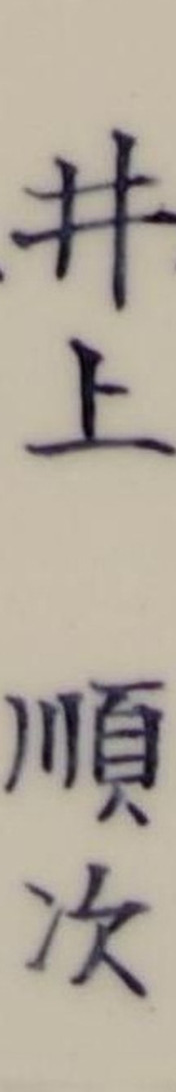井上順次
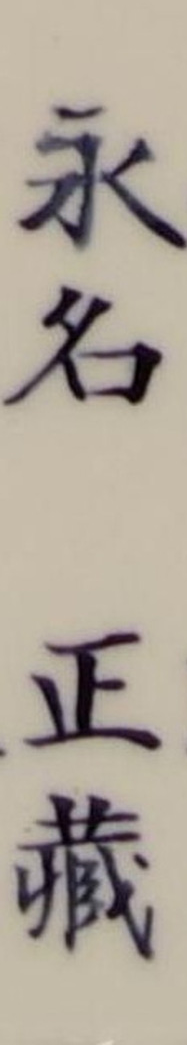永名正蔵
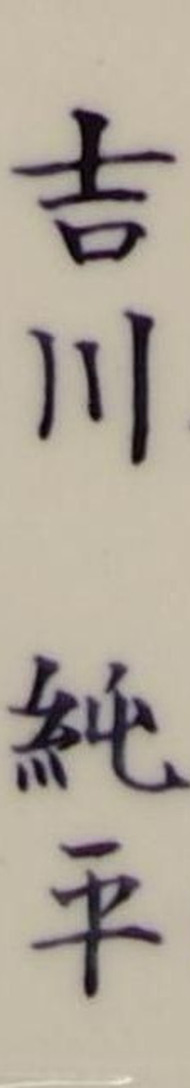吉川純平
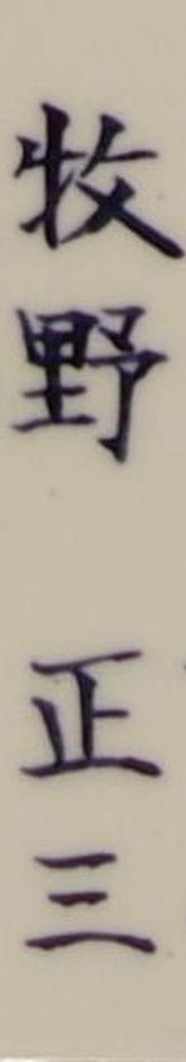牧野正三
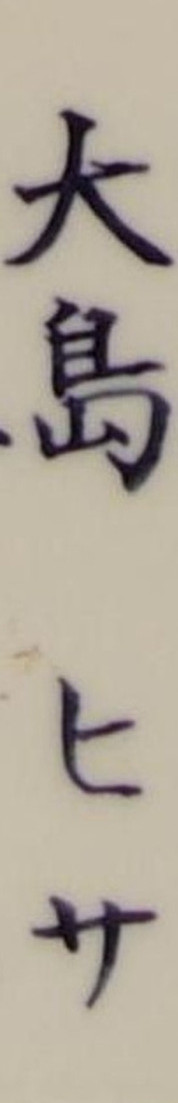大島ヒサ
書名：M~S
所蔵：高野山金剛峯寺
